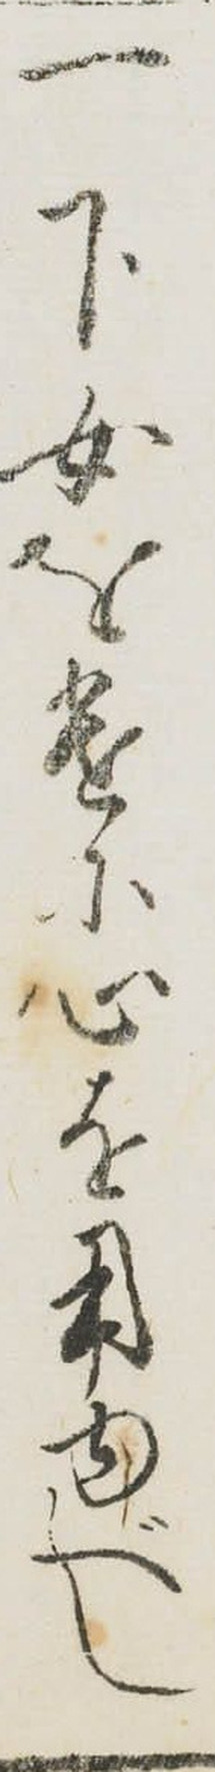一下女を遣に心を用ゆべし
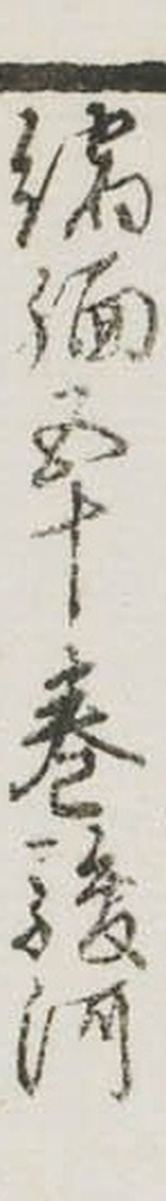縮緬五十巻駿河
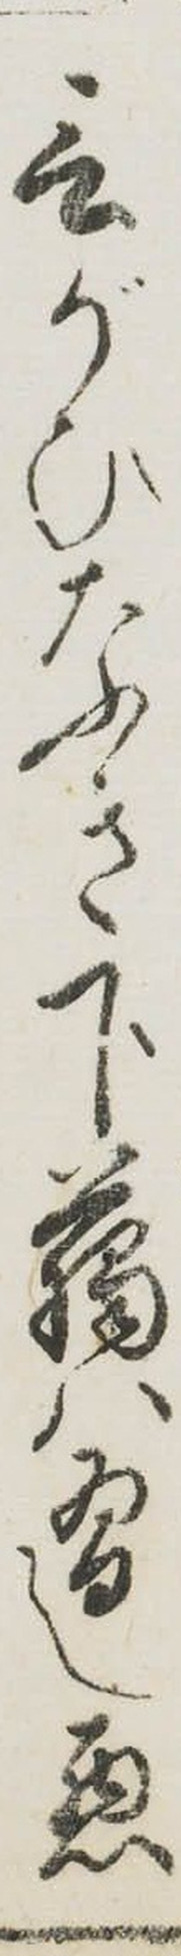言がひなき下臈は習し悪
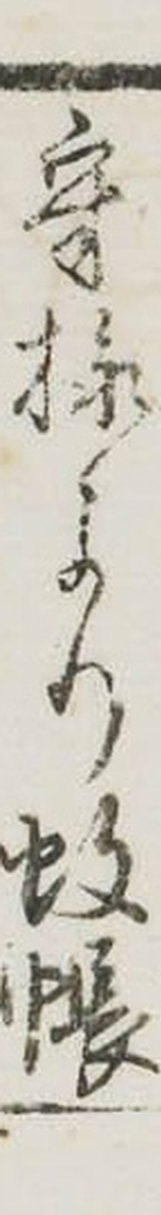守様より蚊帳
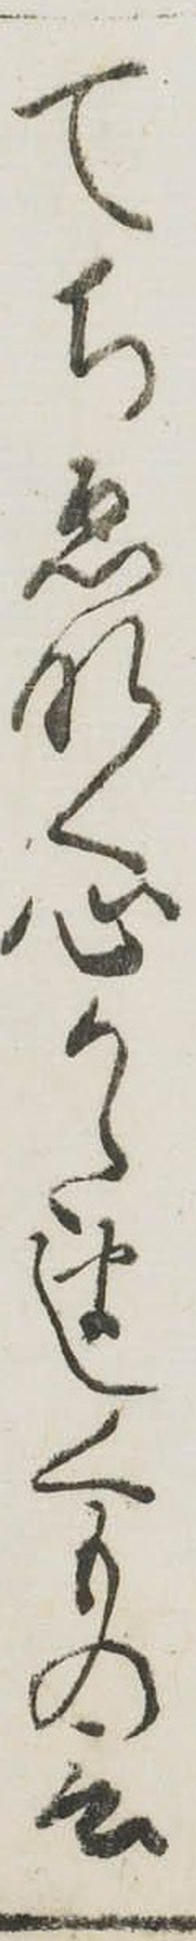てちゑなく心かたましくもの言
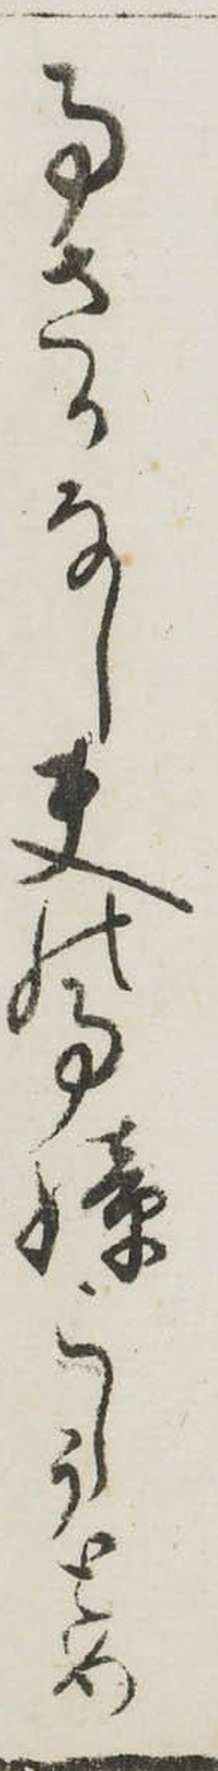事さかなし夫の事嫜こしうとめ
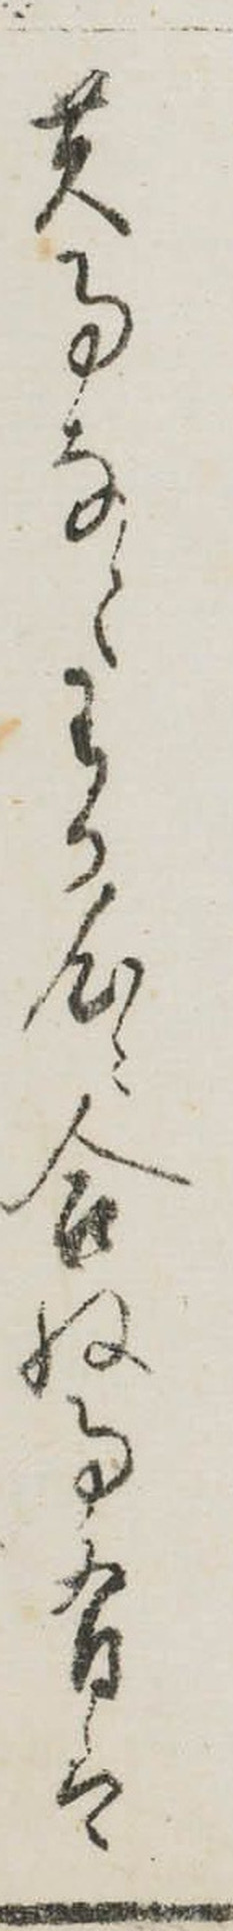笑事なとわか心合ぬ事有は
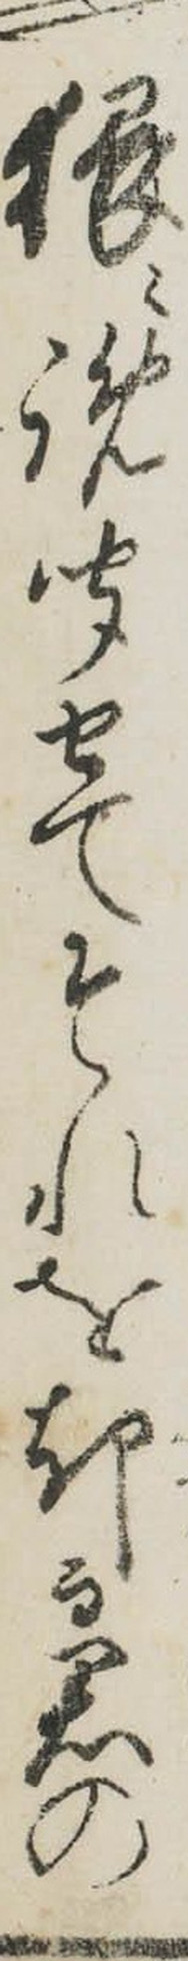猥謗聞せてそれを却而君の

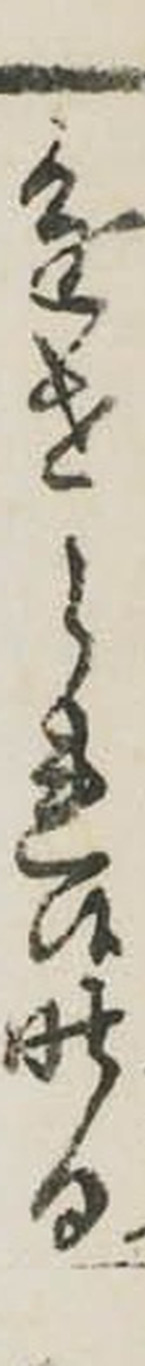進せられ候昨日
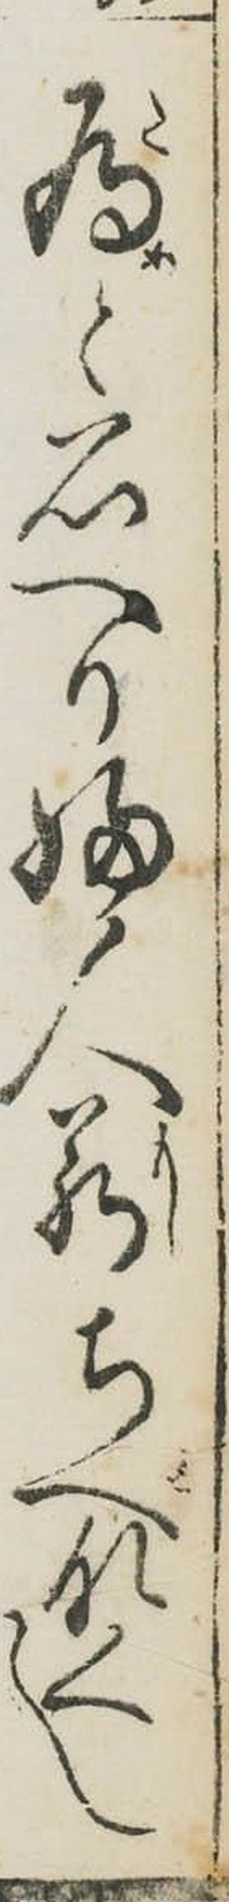為と思へり婦人若ちへなくし
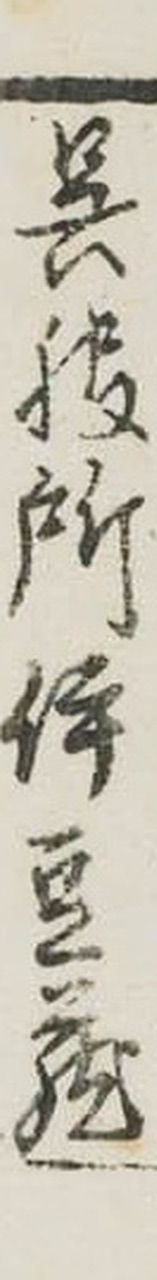呉服所伊豆蔵
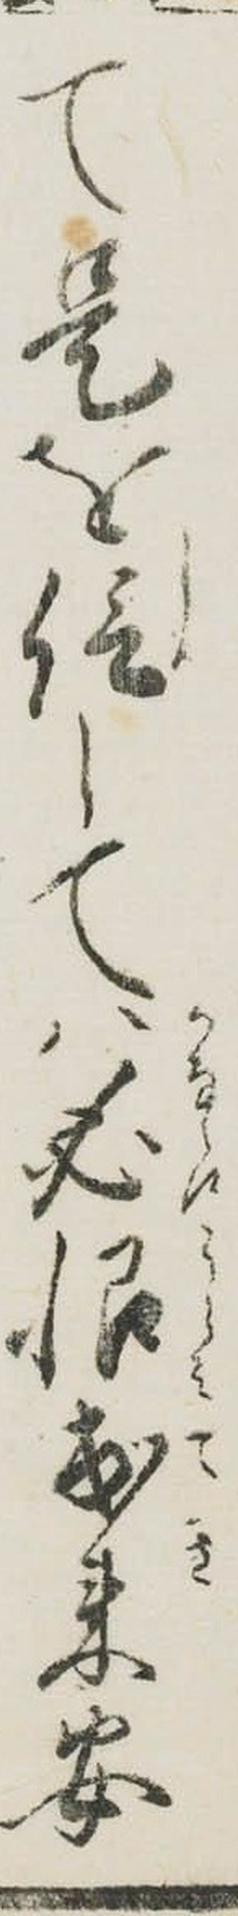て是を信しては必恨出来安
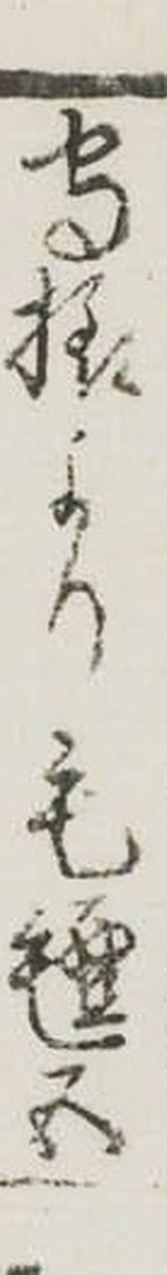守様より毛氈五
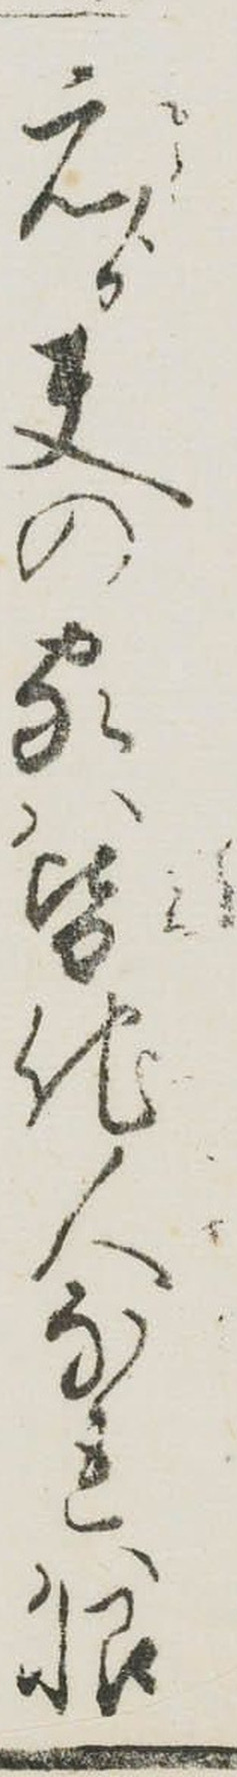元より夫の家は皆他人なれは恨
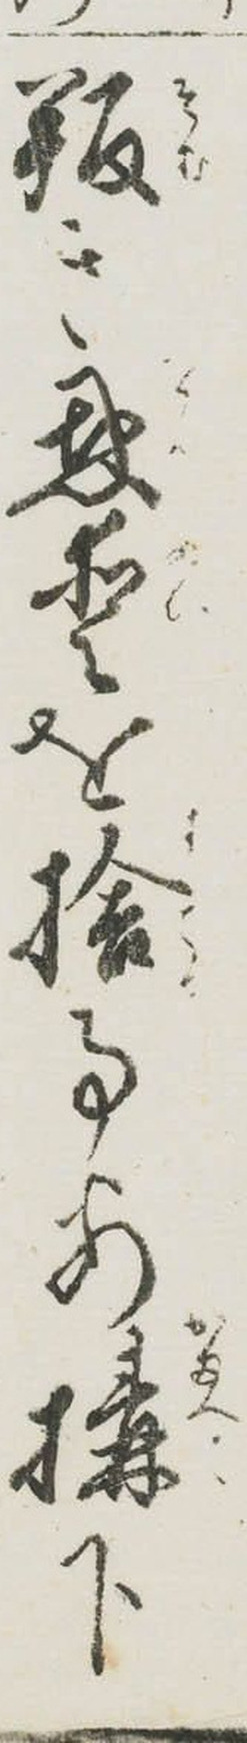叛き忍愛を捨事安構下
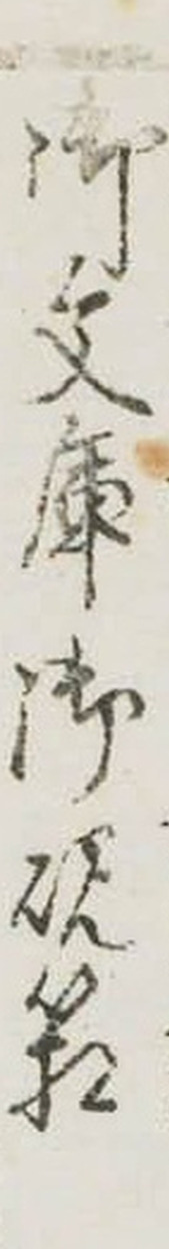御文庫御硯箱
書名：女大学
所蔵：東京学芸大学教育コンテンツアーカイブ
